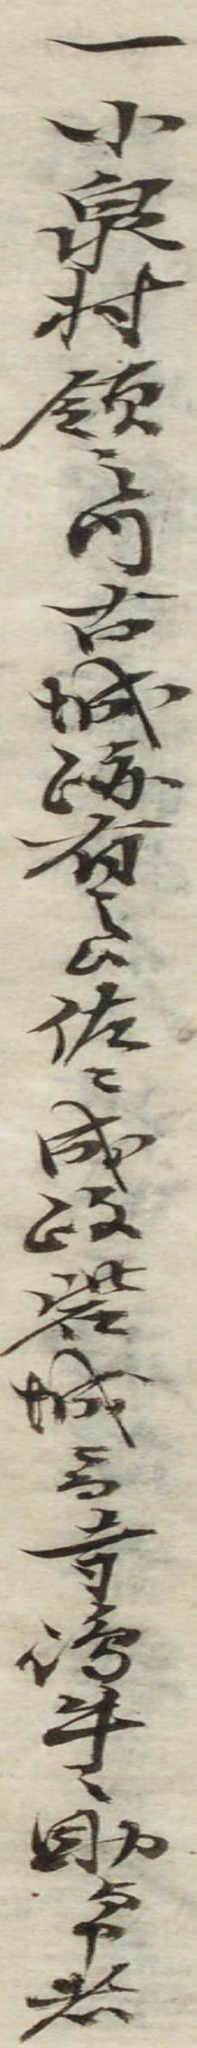一小泉村領之内古城跡有之候佐々成政砦城に而寺嶋牛之助与申者
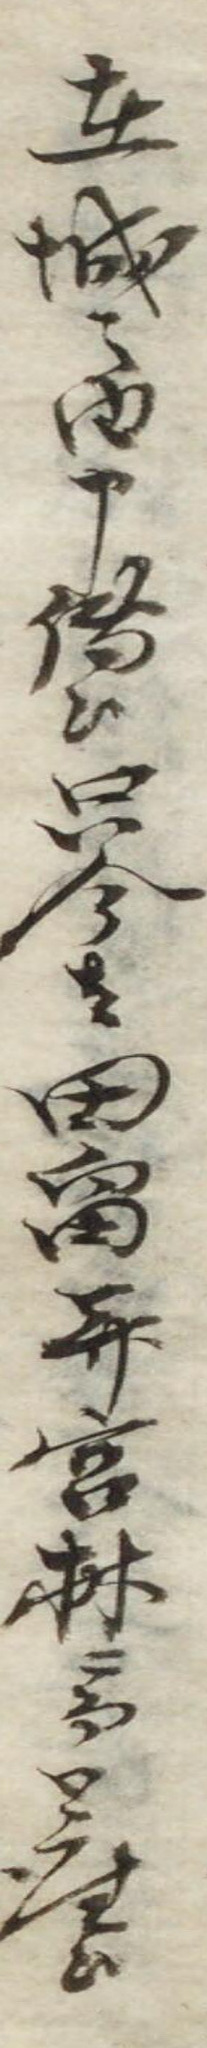在城之由申伝候只今は田畠并宮林に而御座候
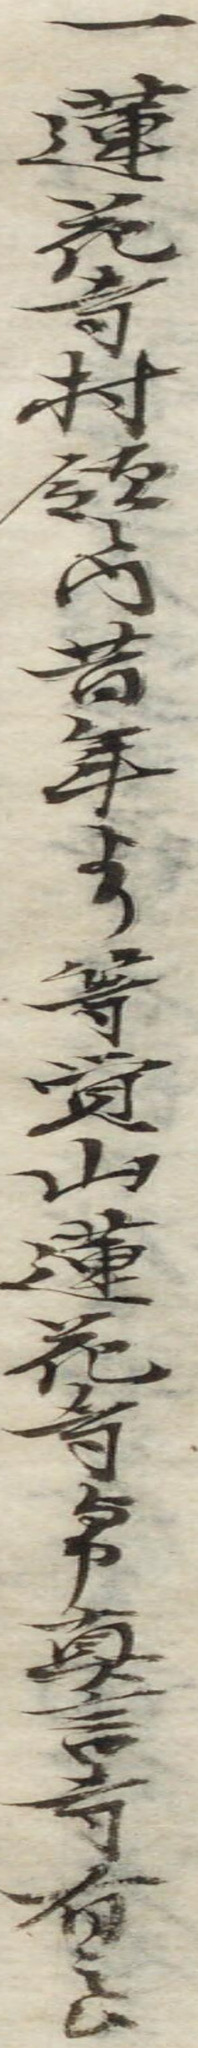一蓮花寺村領之内昔年より等覚山蓮花寺与申真言寺有之候
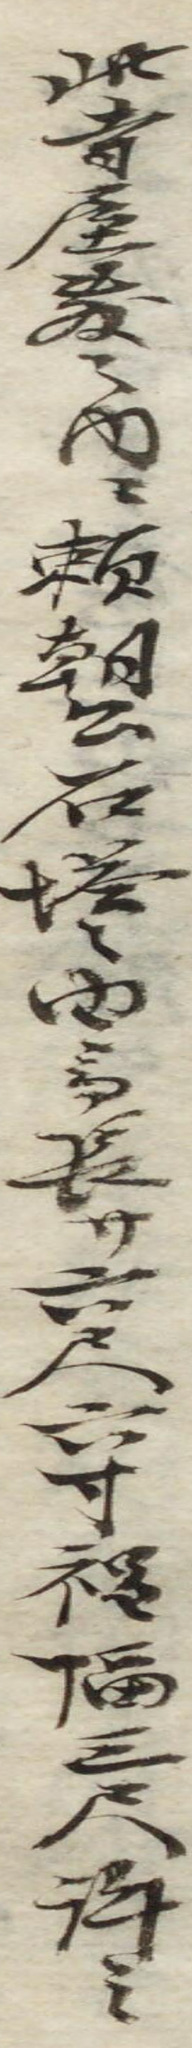此寺屋敷之内に頼朝公石塔之由に而長さ六尺六寸程幅三尺許之
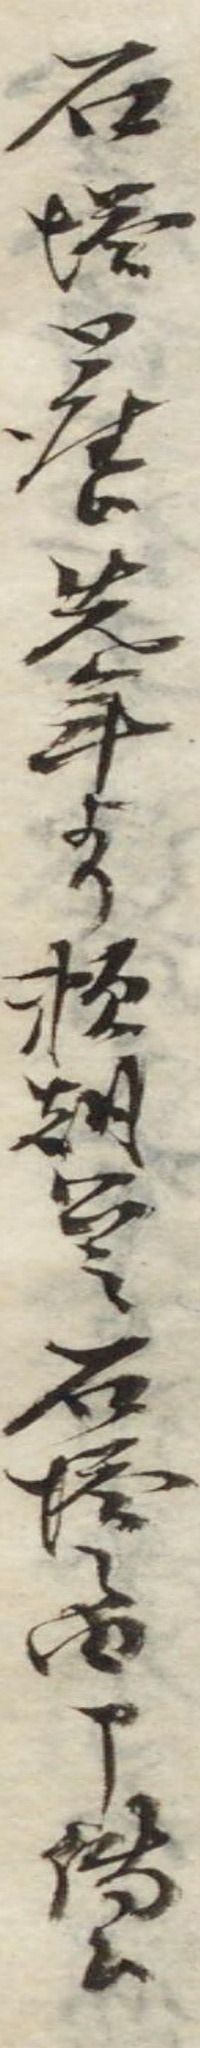石塔御座候先年より頼朝公之石塔之由申伝候
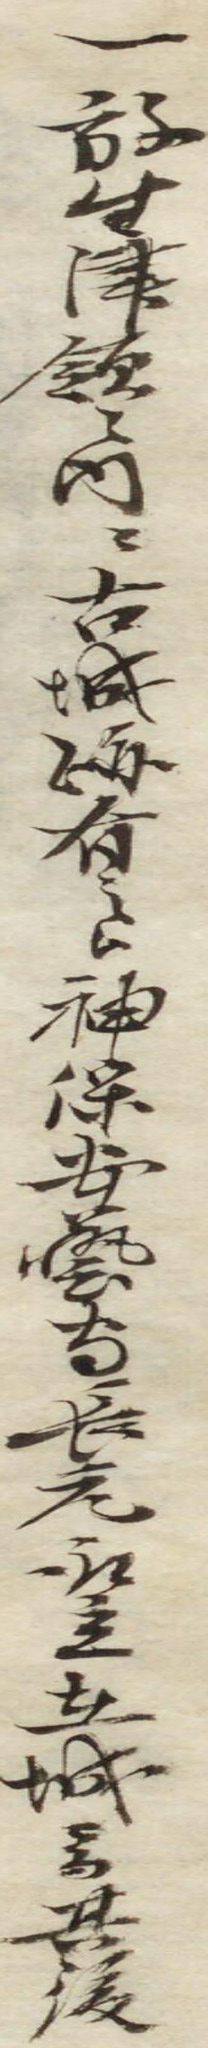一放生津領之内に古城跡有之候神保安芸守長元取立在城に而其後
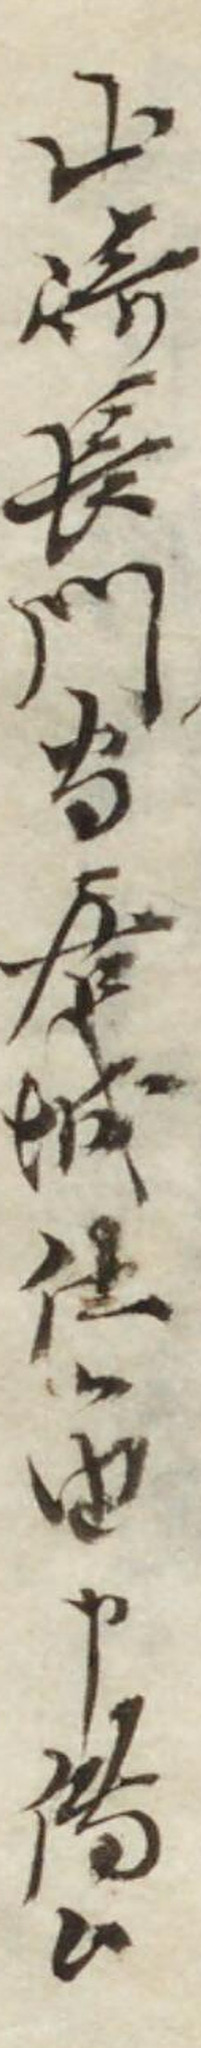山崎長門守居城仕候由申伝候
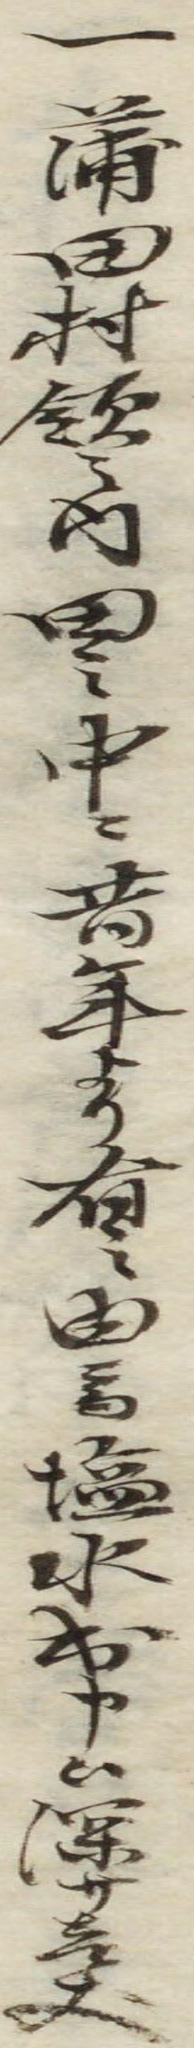一蒲田村領之内田之中に昔年より有之由に而塩水出申候深さ壱丈
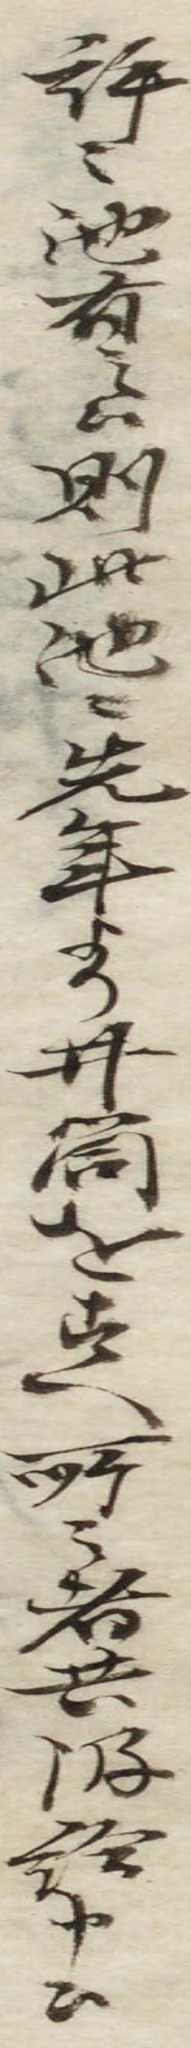許之池有之候則此池に先年より井筒をすへ所之者共汲給申候
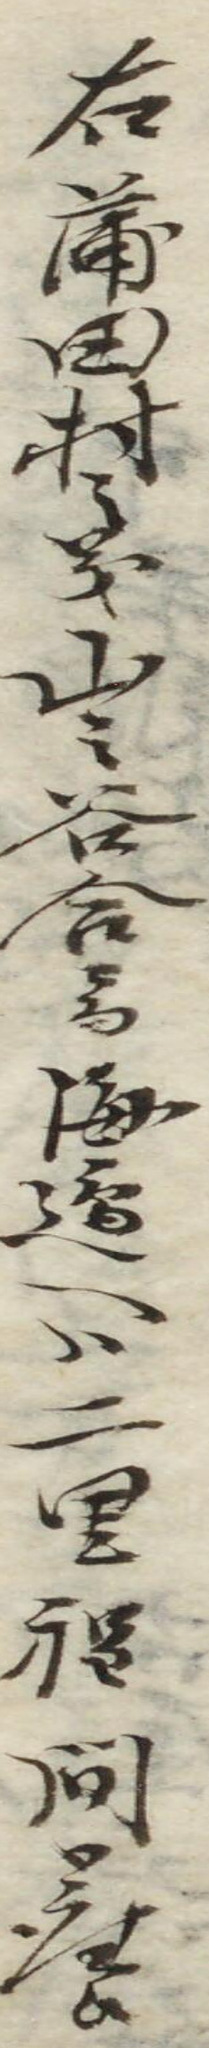右浦田村之義山之谷合に而海辺へは二里程間御座候
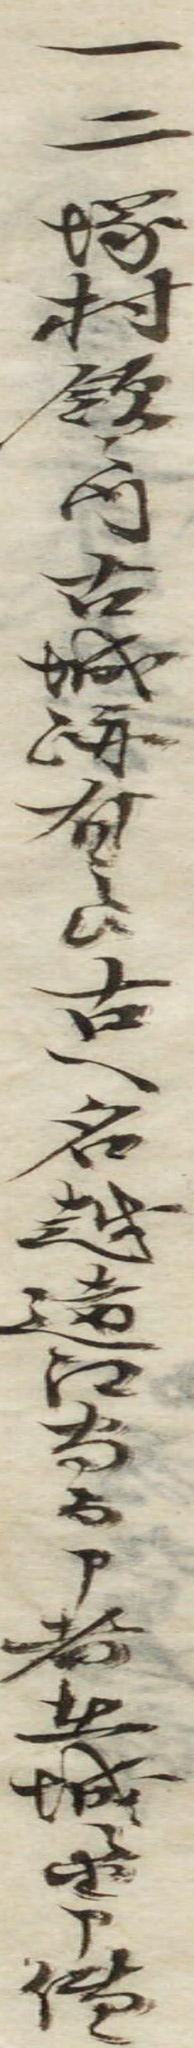一二塚村領之内古城跡有之候古へ名越遠江守与申者在城之由申伝候
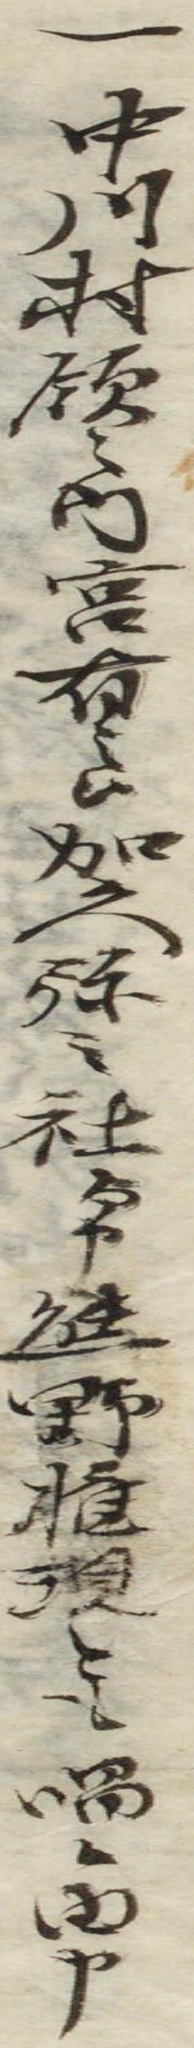一中川村領之内宮有之候加久弥之社与申熊野権現とも唱候由申
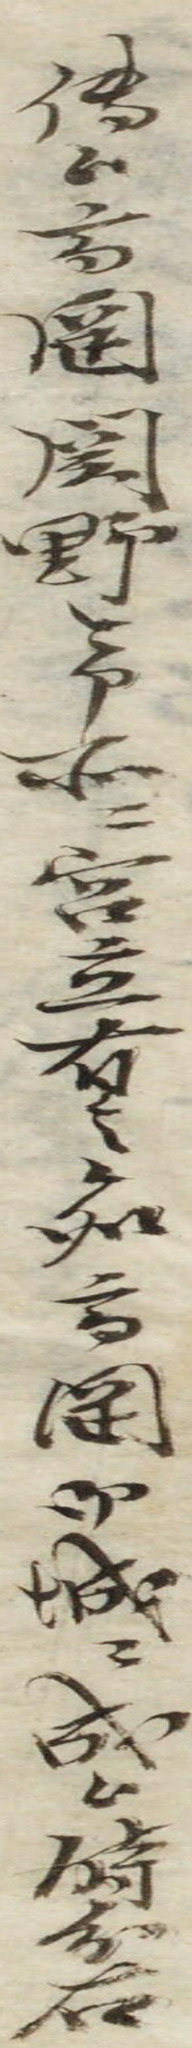伝候高岡関野と申所に宮立有之候処高岡御城に成候時分右
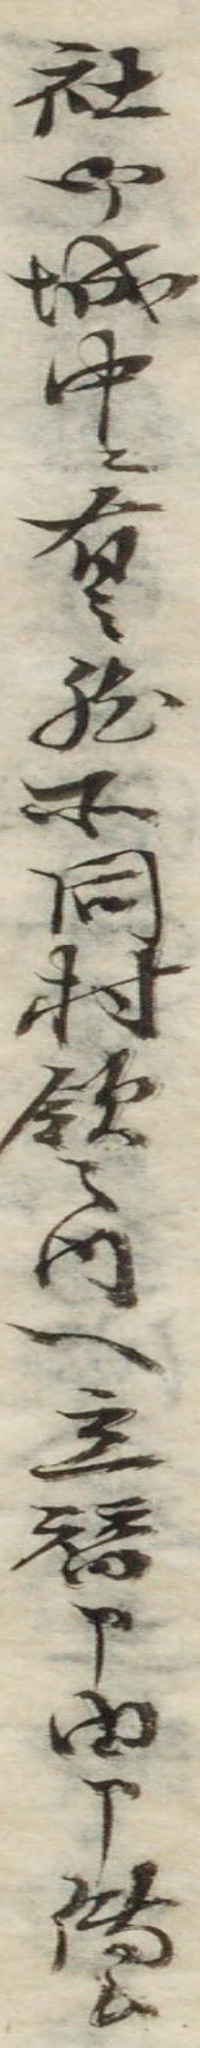社御城中に有之然所道村領之内へ立替申由申伝候
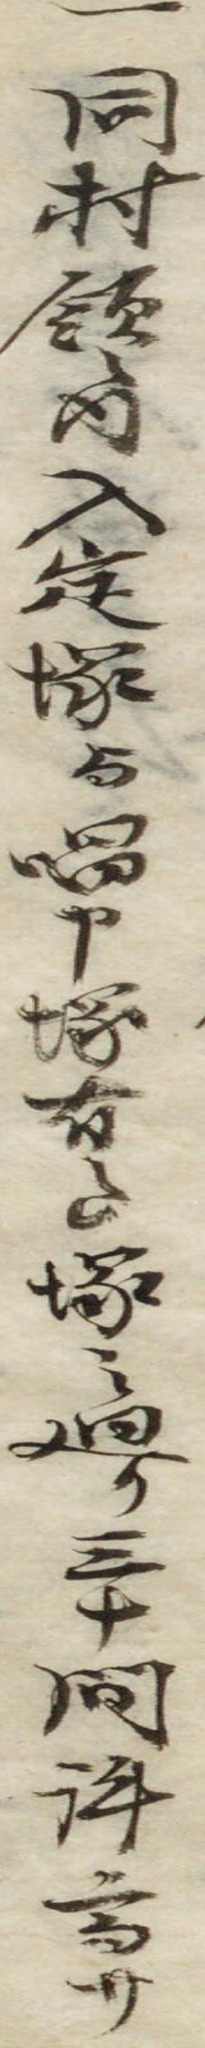一同村領之内入定塚与唱申塚有之候塚之廻り三十間許高さ
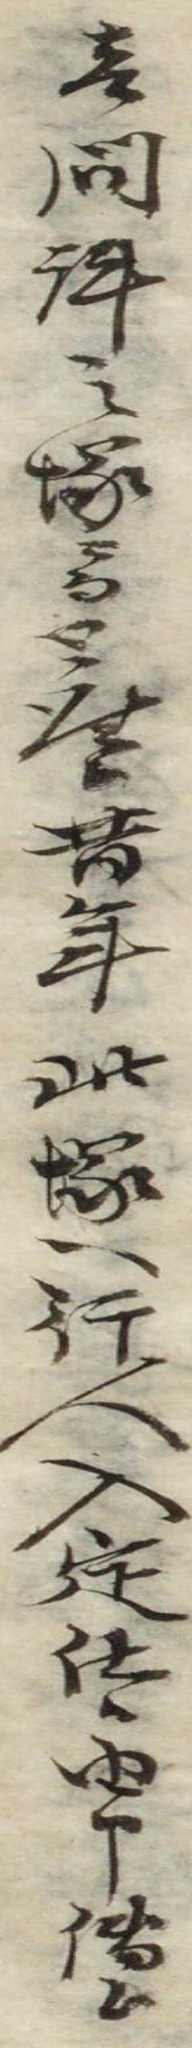壱間許之塚に而御座候昔年此塚へ行人入定仕候由申伝候
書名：加越能旧聞録
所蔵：Ishikawa Prefectural Library
